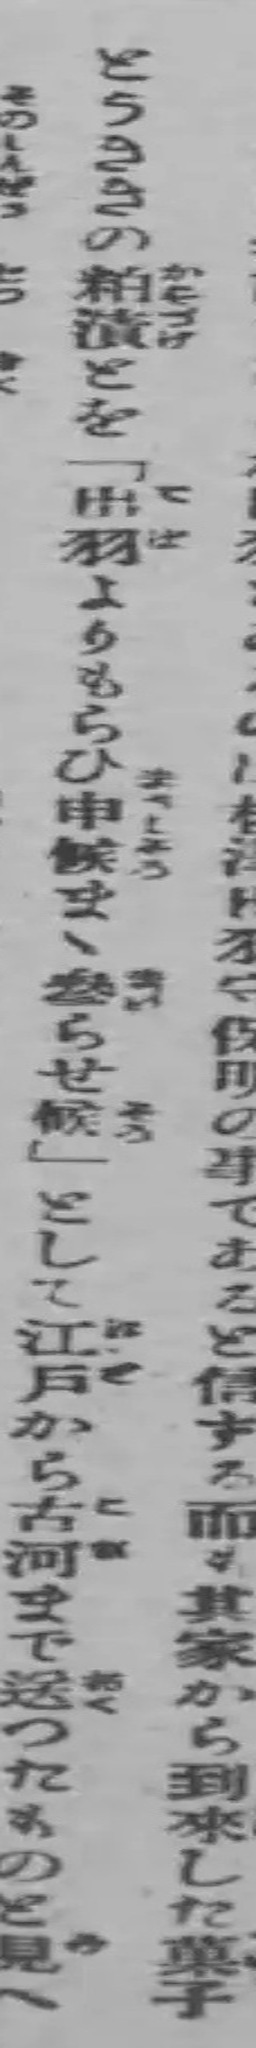とうききの粕漬とを「出羽よりもらひ申候まゝ参らせ候」として江戸から古河まで送つたものと見へ
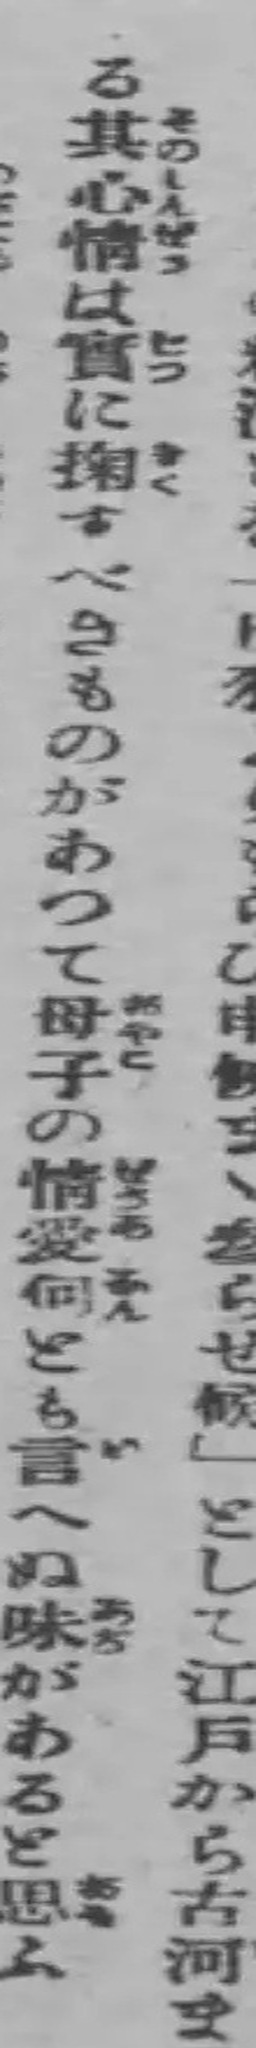る其心情は実に掬すべきものがあつて母子の情愛何とも言へぬ味があると思ふ
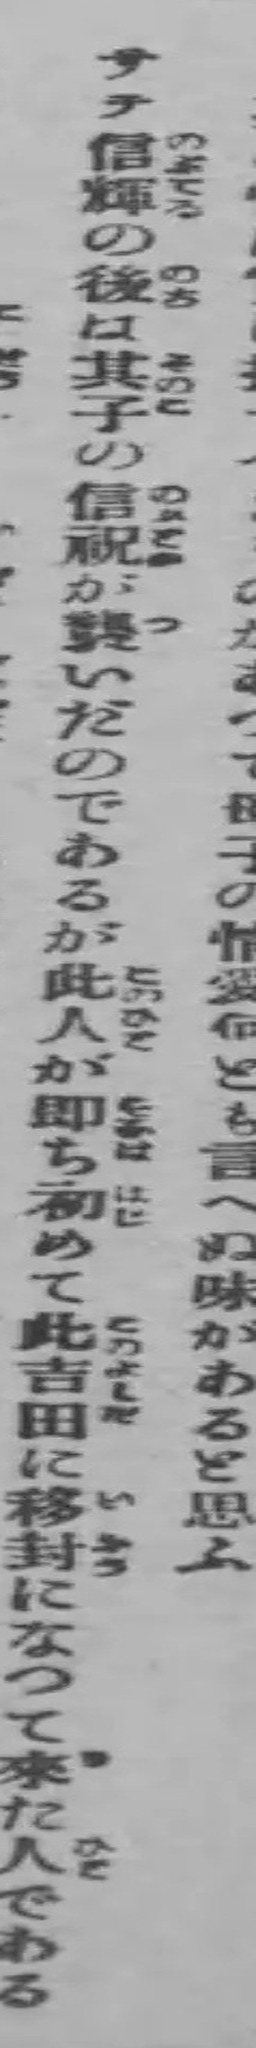サテ信輝の後は其子の信祝が襲いだのであるが此人が即ち初めて此吉田に移封になつて来た人である
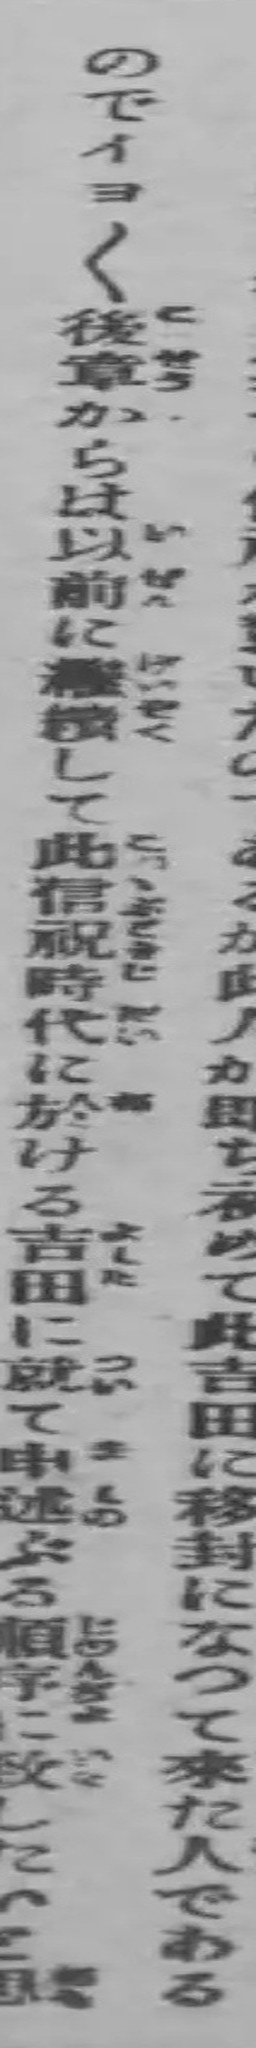のでイヨ〳〵後章からは以前に継続して此信祝時代に於ける吉田に就て申述ぶる順序に致したいと思
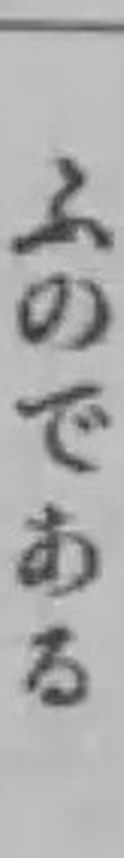ふのである
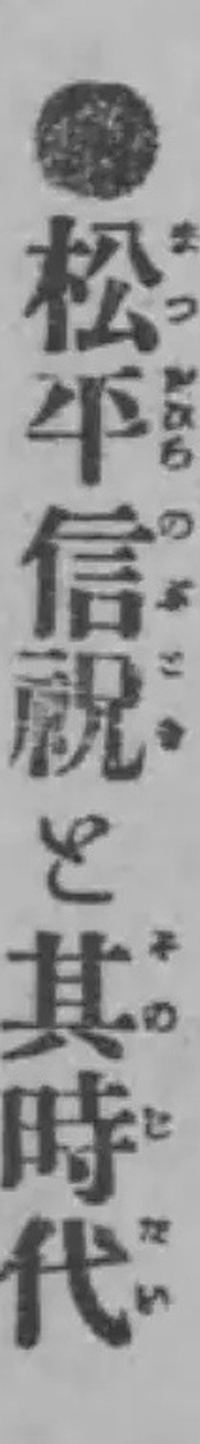●松平信祝と其時代
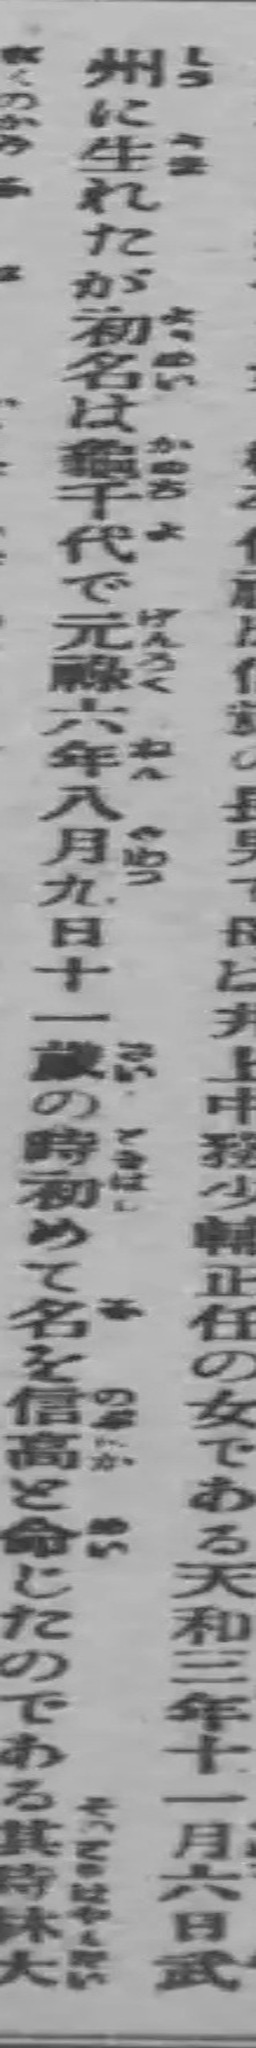州に生れたが初名は亀千代で元禄六年八月九日十一歳の時初めて名を信高と命じたのである其時林大
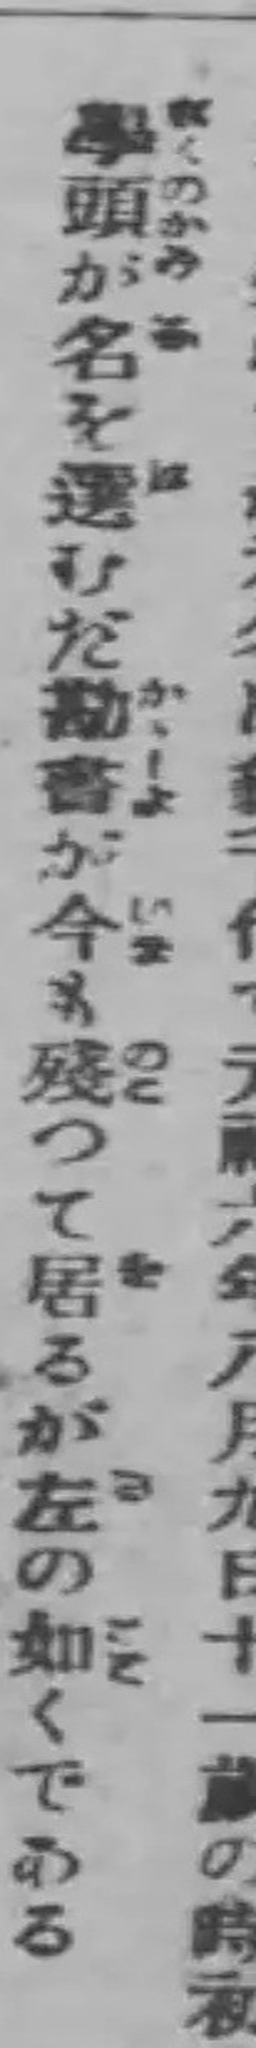学頭が名を選むだ勘書が今も残つて居るが左の如くである
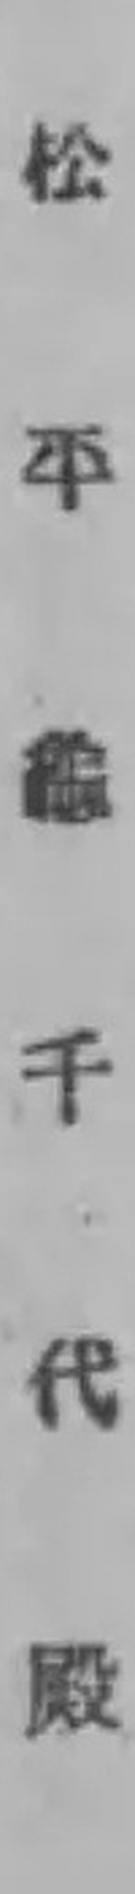松平亀千代殿
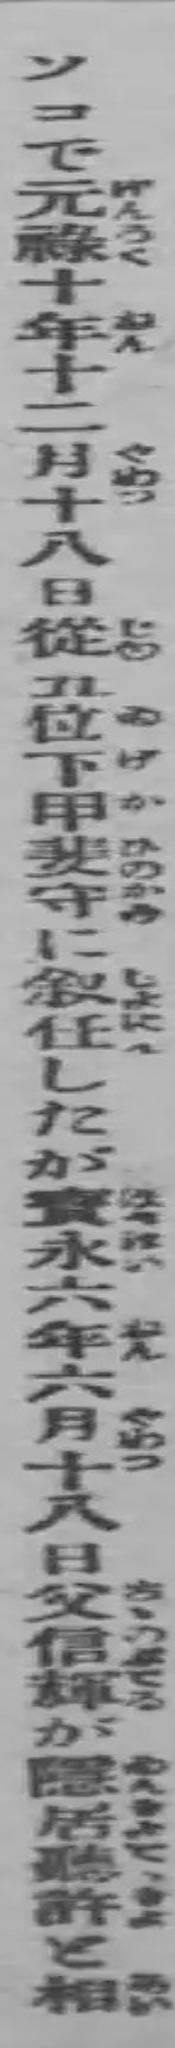ソコで元禄十年十二月十八日従五位下甲斐守に叙任したが宝永六年六月十八日父信輝が隠居聴許と相
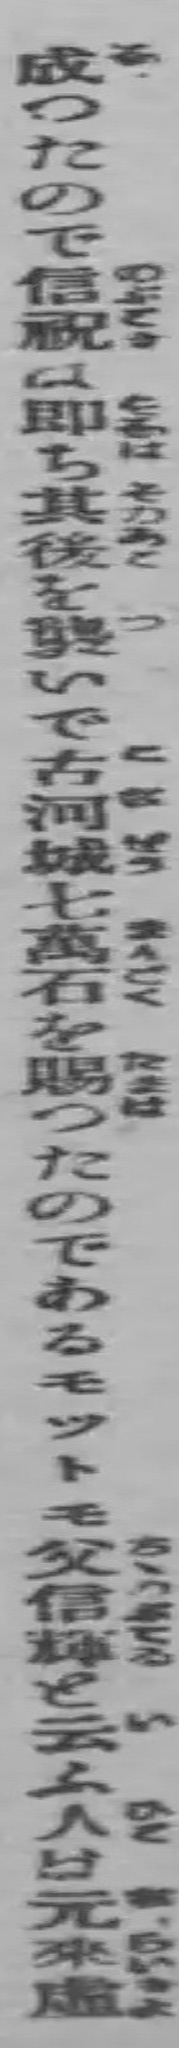成つたので信祝は即ち其後を襲いで古河城七万石を賜つたのであるモツトモ父信輝といふ云ふ人は元来虚
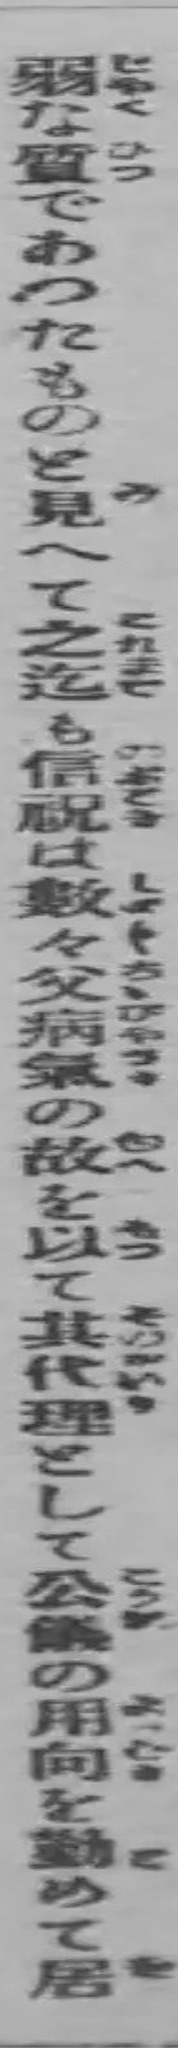弱な質であつたものと見へて之迄も信祝は数々父病気の故を以て其代理として公儀の用向を勤めて居
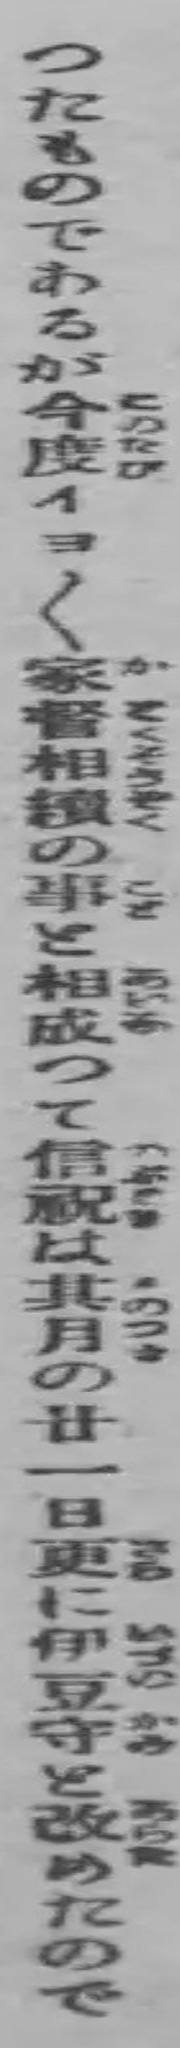つたものであるが今度イヨ〳〵家督相続の事と相成つて信祝は其月の廿一日更に伊豆守と改めたので
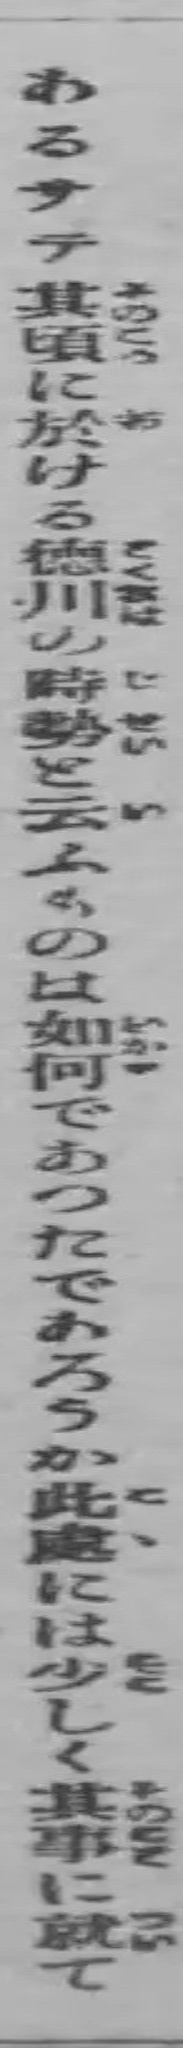元禄時代あるサテ其頃に於ける徳川の時勢と云ふものは如何であつたであろうか此処には少しく其事に就て
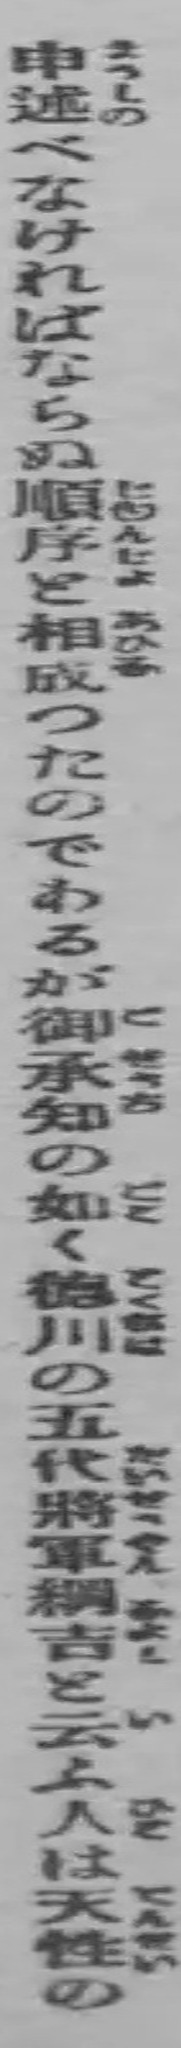申述べなければならぬ順序と相成つたのであるが御承知の如く五代将軍綱吉と云ふ人は天性の
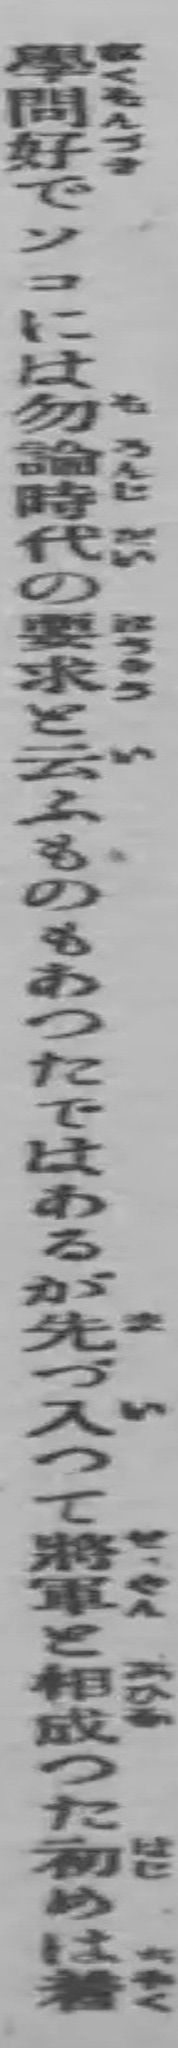学問好でソコには勿論時代の要求と云ふものもあつたではあるが先づ入つて将軍と相成つた初めは着
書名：豊橋市史談
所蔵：国立国会図書館 National Diet Library, JAPAN
